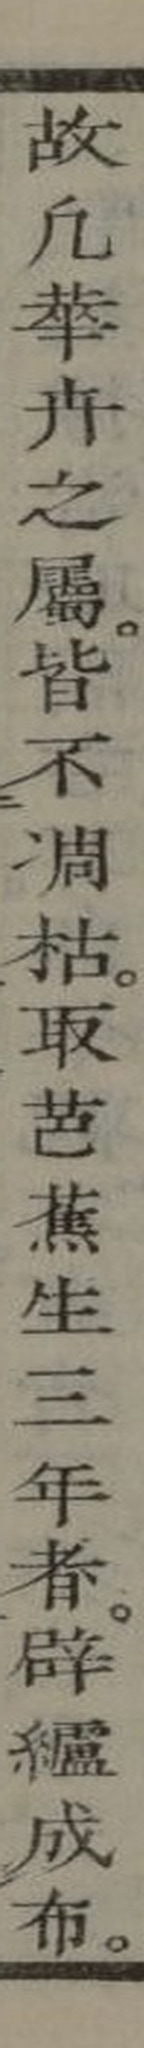故凢蕐卉之屬。皆不凋枯。取芭蕉生三年者。辟纑成布。
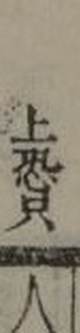上恐只
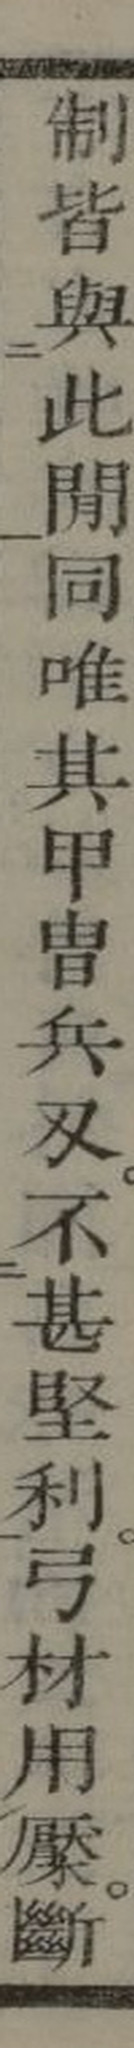制。皆與此閒同。唯其甲冑兵刃。不甚堅利。弓材用檿。斷
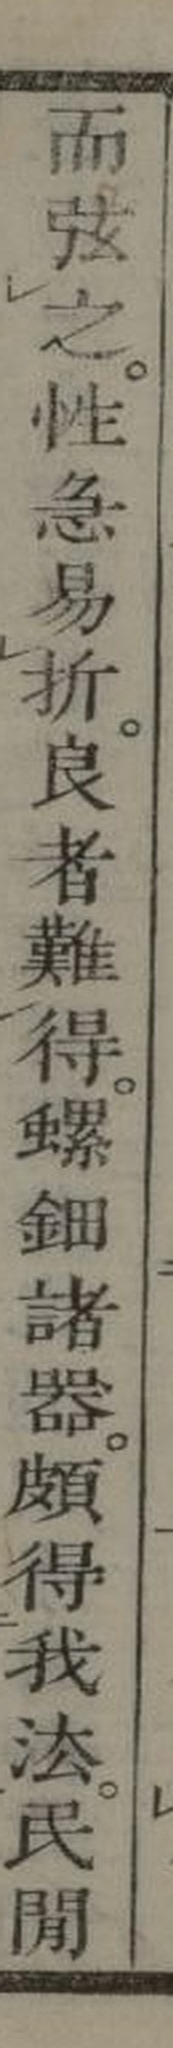而弦之。性急易折。良者難得。螺鈿諸器。頗得我㳒。民閒
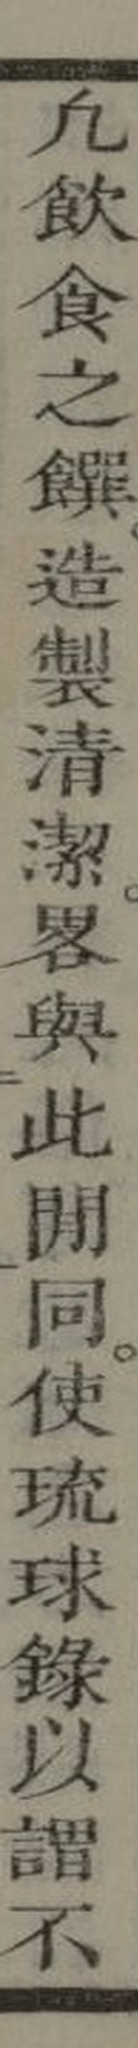凢飲食之饌。造製清潔。畧與此閒同。使琉球錄以謂不

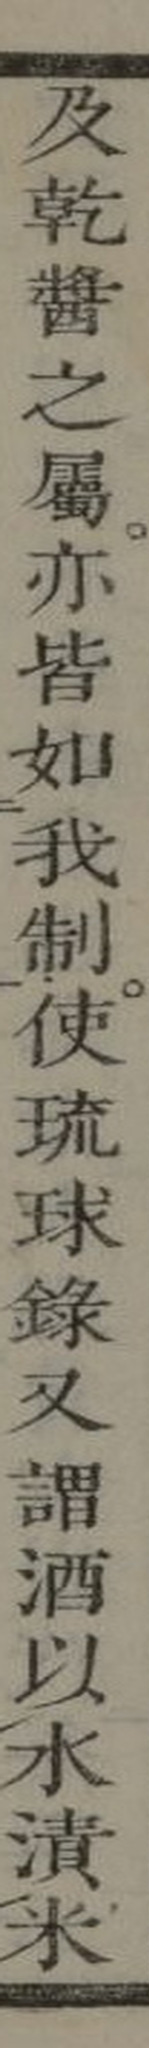及乾醬之屬。亦皆如我制。使琉球錄又謂酒以水漬米
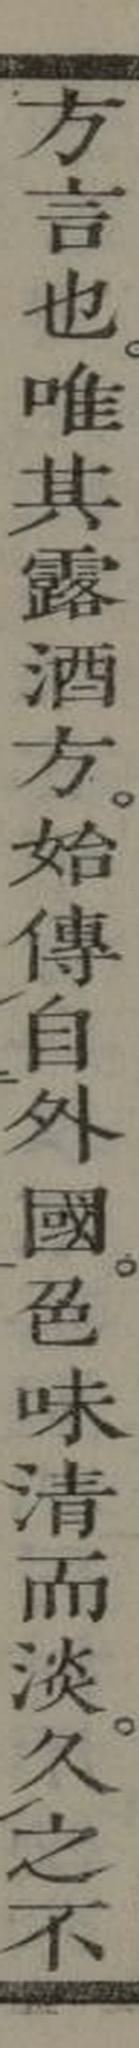方言也。唯其露酒方。始傳自外國。色味清而淡。久之不
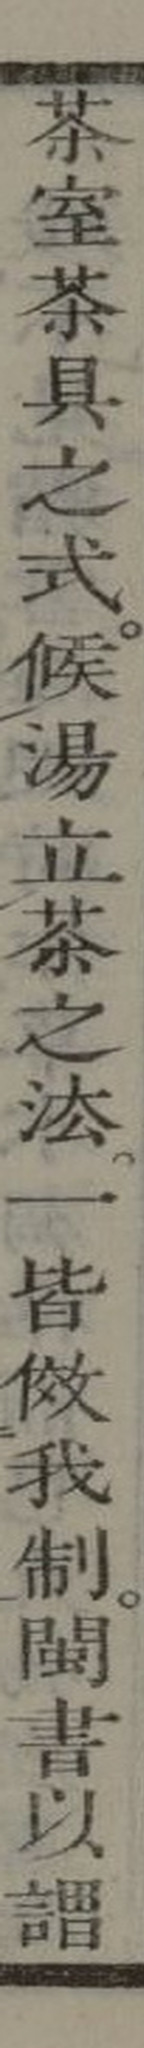茶室茶具之式。候湯立茶之㳒。一皆傚我制。閩書以謂
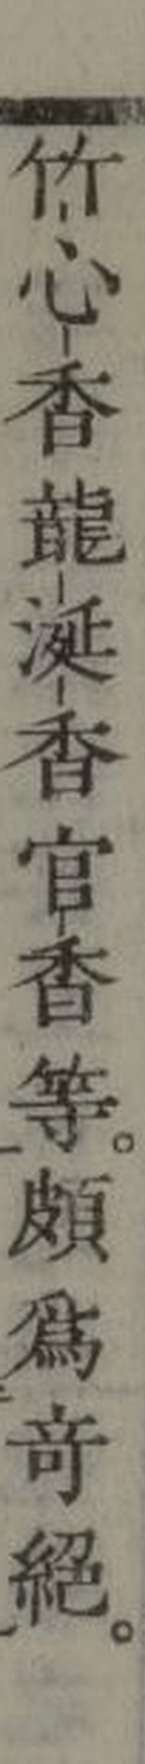竹-心-香龍-涎-香官-香等。頗爲竒絕。
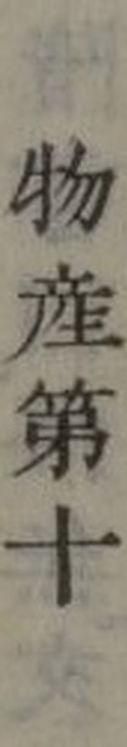物産第十

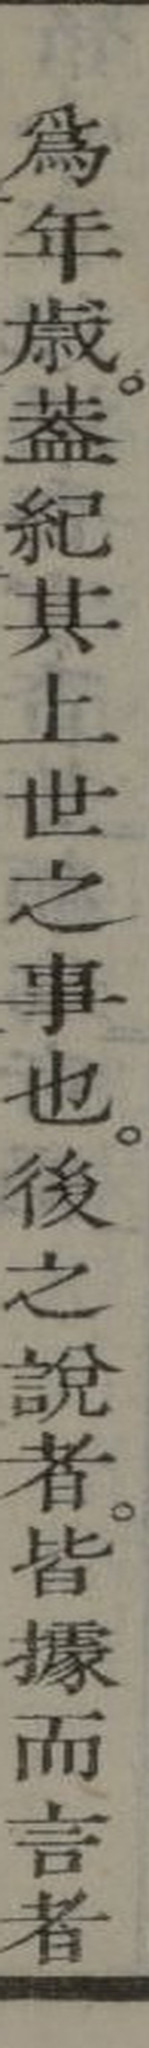爲年歳。葢紀其上世之事也。後之說者。皆據而言者
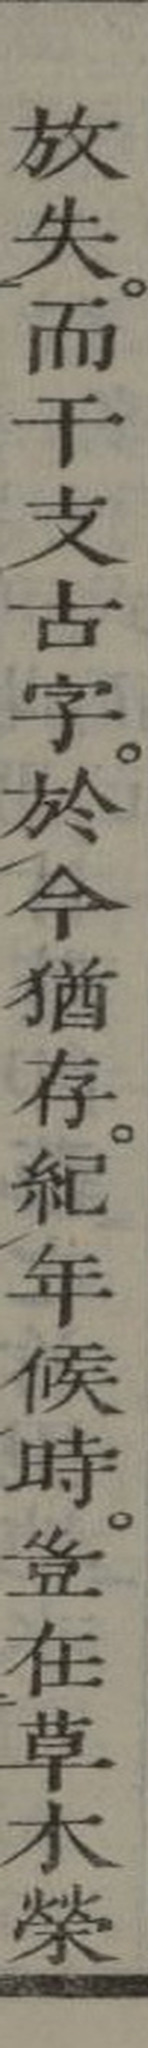放失。而干支古字。於今猶存。紀年候時。豈在草木榮
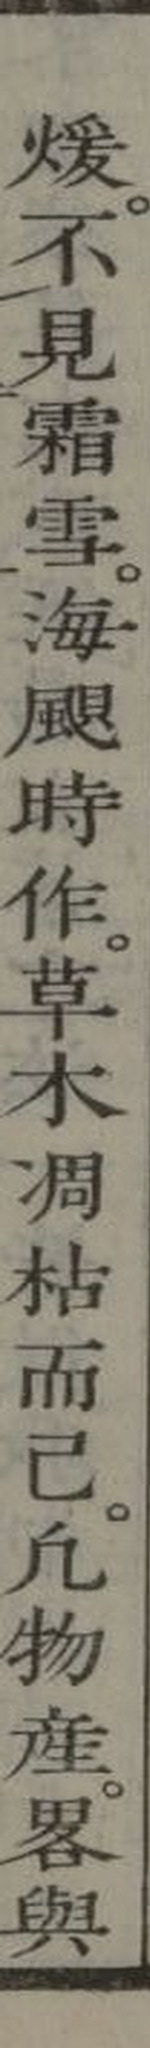煖。不見霜雪。海颶時作。草木凋枯而已。凢物産。畧與
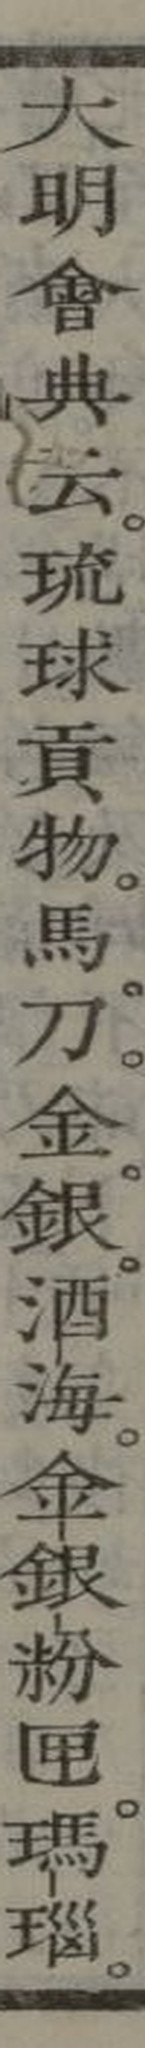大明會典云。琉球貢物。馬。刀。金。銀。酒-海。金-銀-粉匣。瑪-瑙。
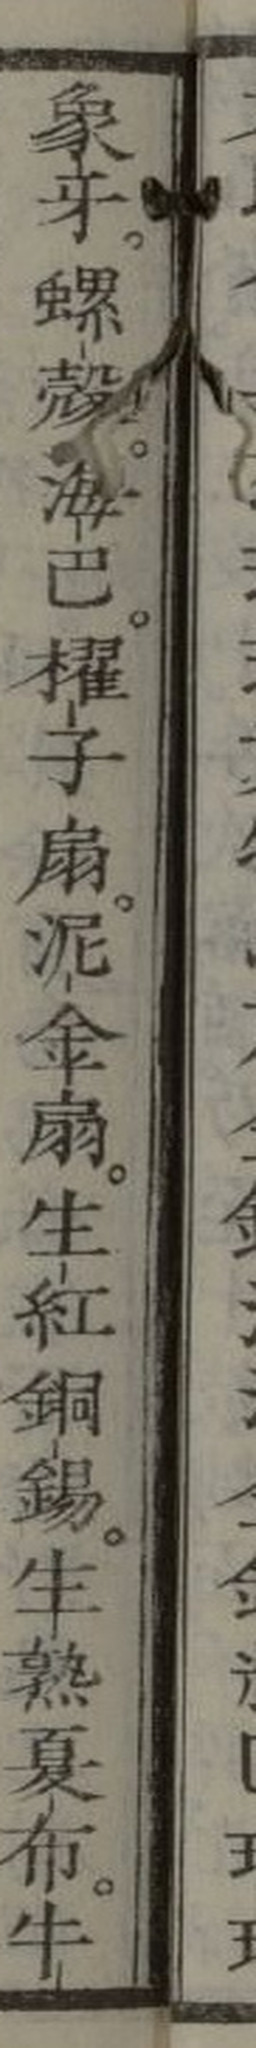象-牙。螺-殻。海-巴。櫂-子扇。泥-金-扇。生-紅銅-錫。生-熟夏-布。牛-
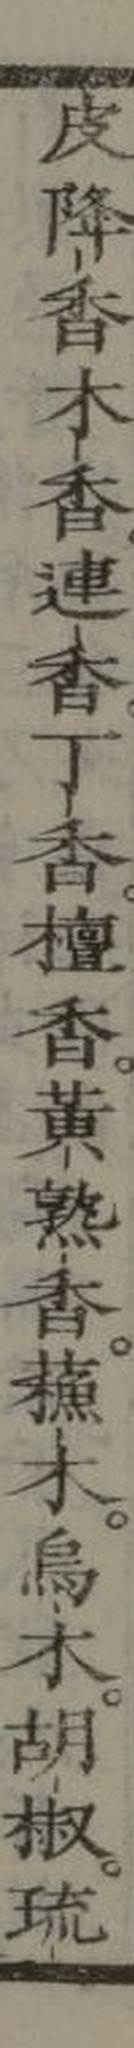皮。降-香。木-香。連-香。丁-香。檀香。黃-熟-香。蘓-木。烏-木。胡-椒。琉-
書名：南島志 呂
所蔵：University of the Ryukyus Library
